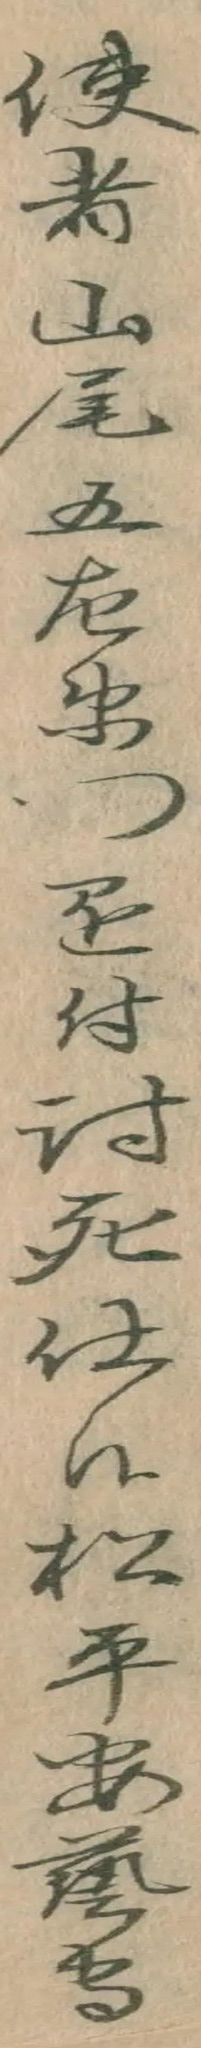使者山尾五左衛門懸付討死仕候松平安芸守
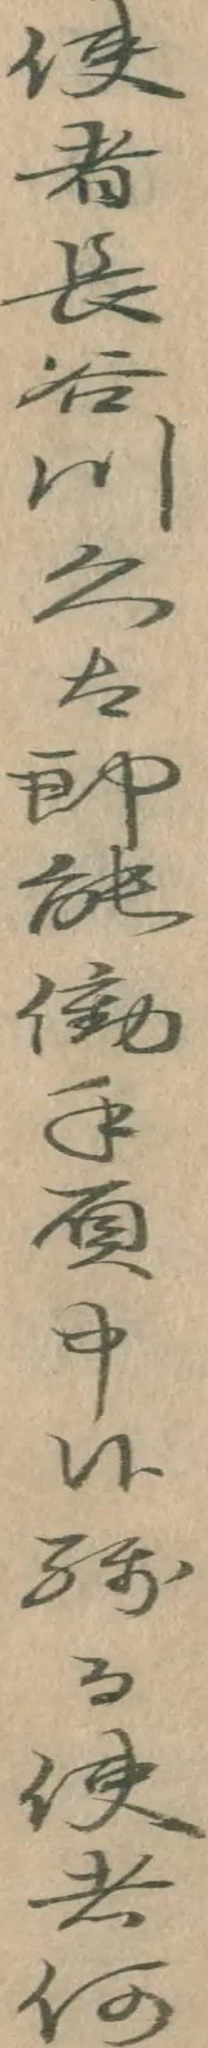使者長谷川久太郎能働手負申候残る使者何
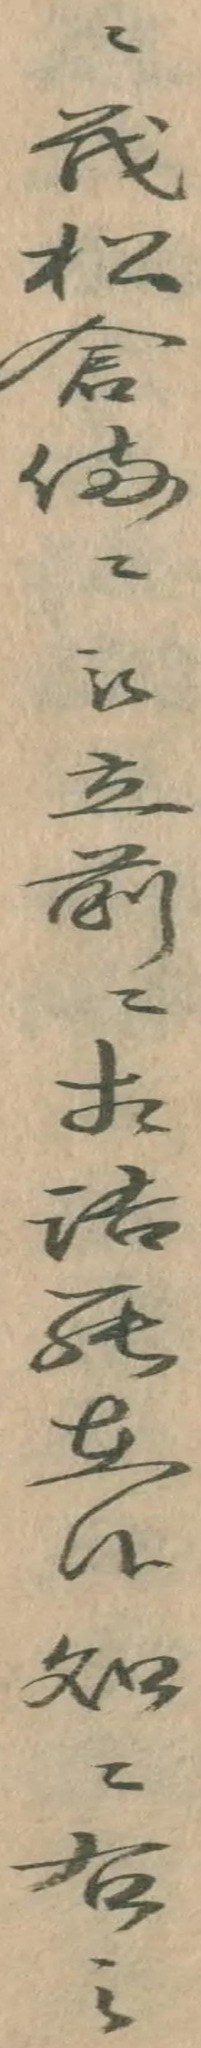に茂松倉備に被立前に相詰罷在候処に右之

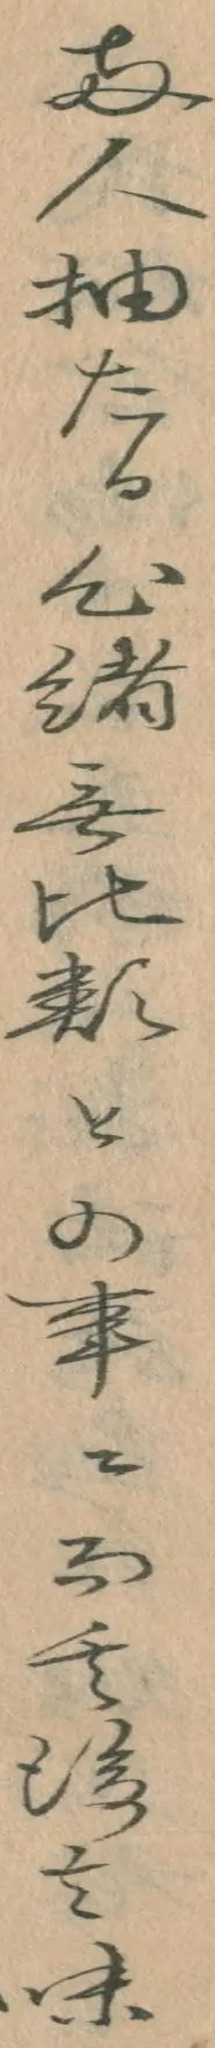両人抽たる心緒無比類との事に而其後者味
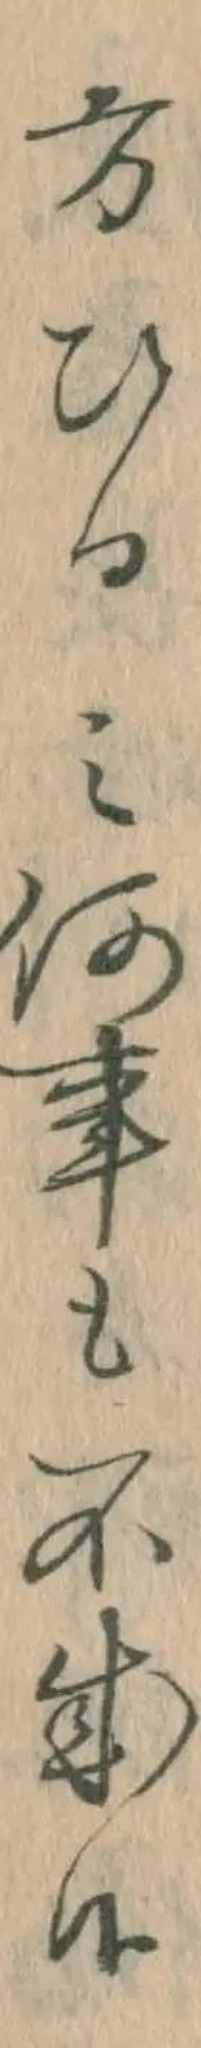方ひる之何事も不成候
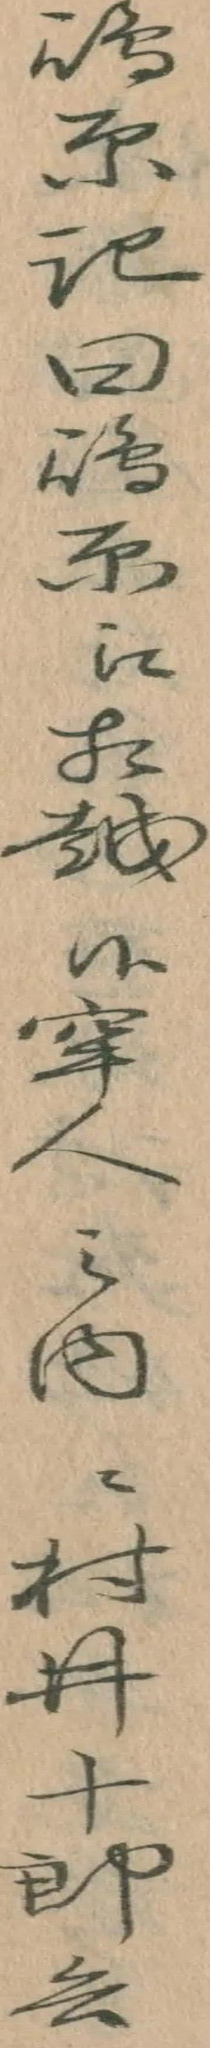島原記曰島原江相越候牢人之内に村井十郎兵
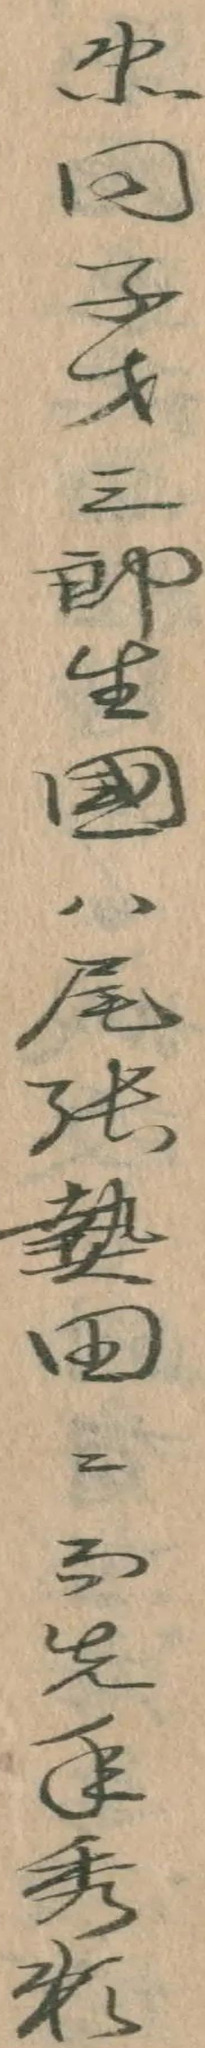衛同子才三郎生国は尾張熱田に而先手秀類
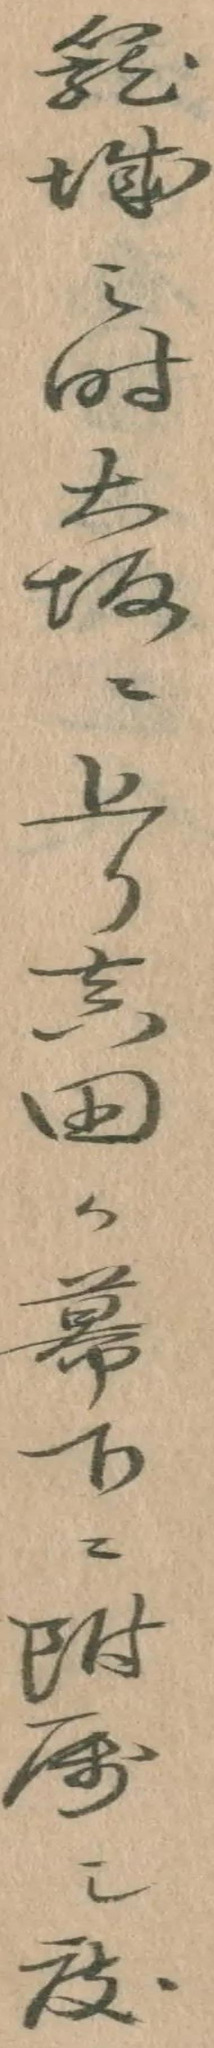籠城之時大坂に上り真田か幕下に附属し度
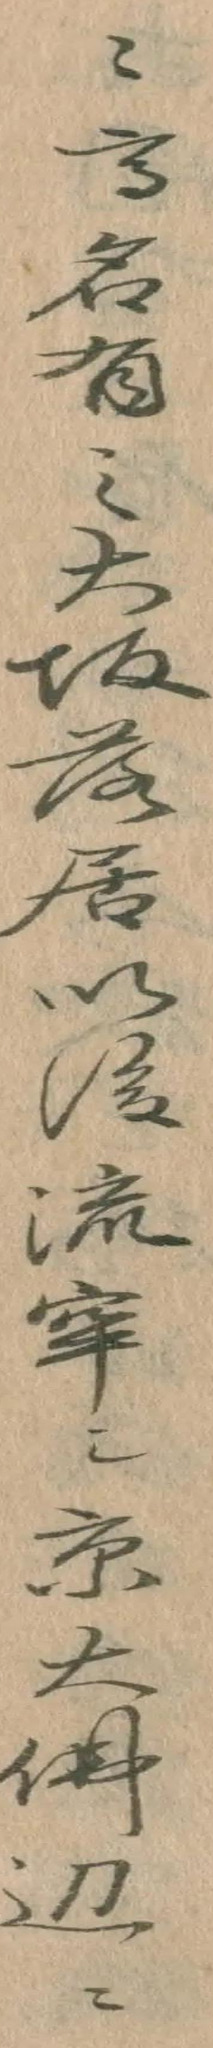々高名有之大坂落居以後流牢し京大払辺に
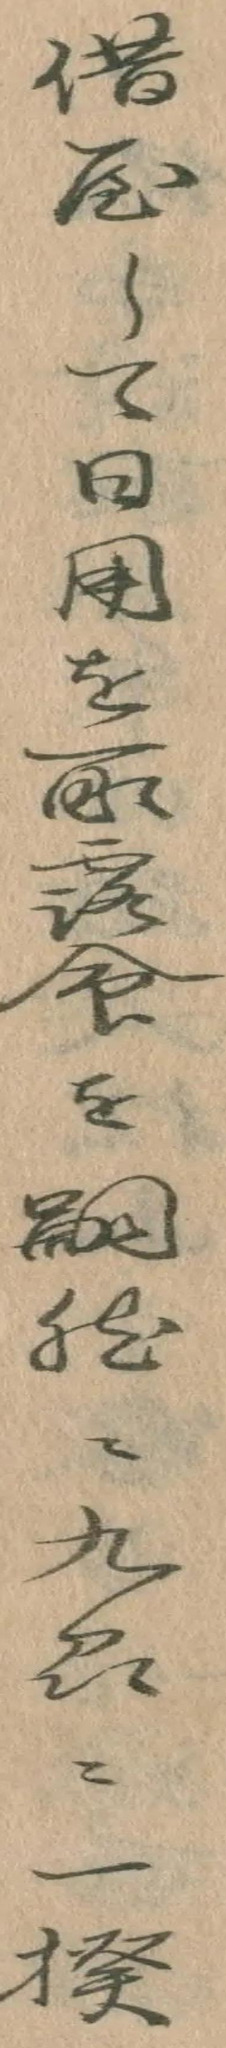借屋して日用を取露命を嗣然に九州に一揆
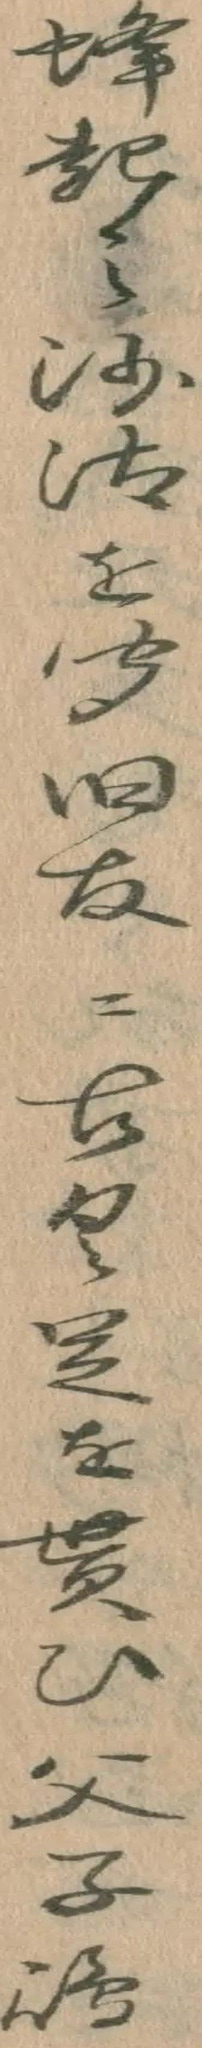蜂起之沙汰を聞旧友に古具足を貰ひ父子島
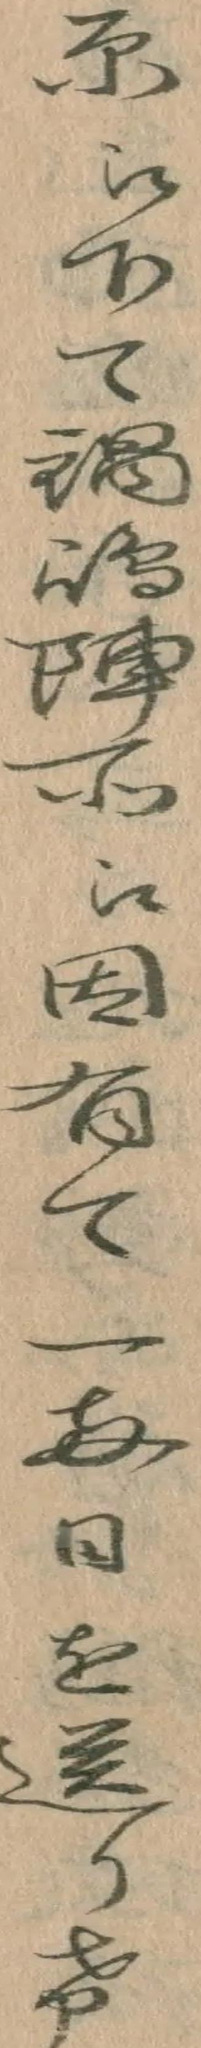原江下て鍋島陣所江因有て一両日を送り希
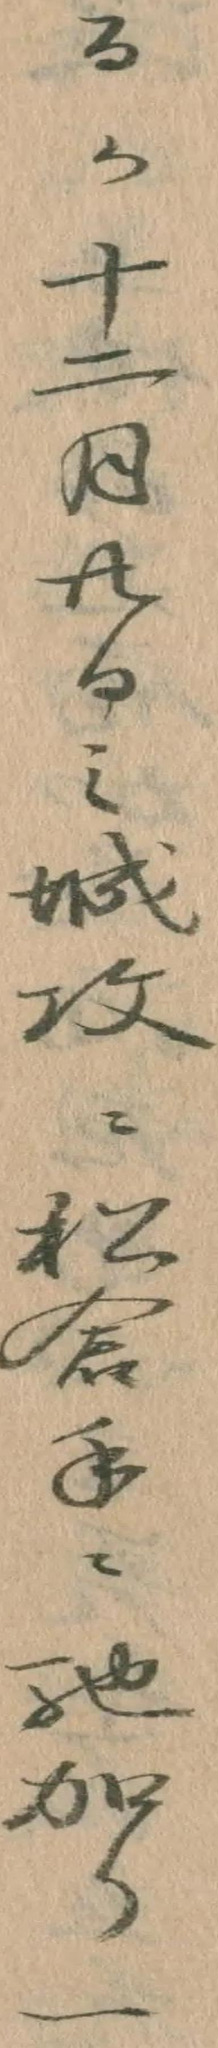るか十二月廿日之城攻に松倉手に馳加り一
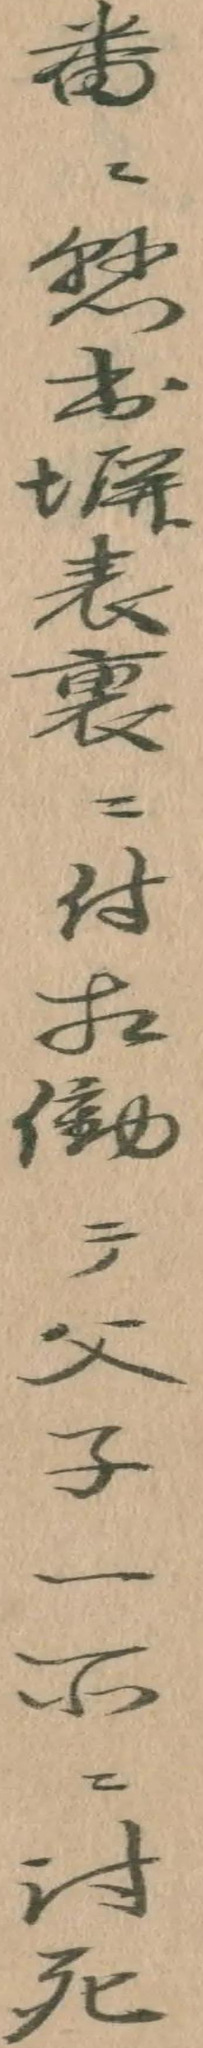番に懸出塀表裏に付相働て父子一所に討死
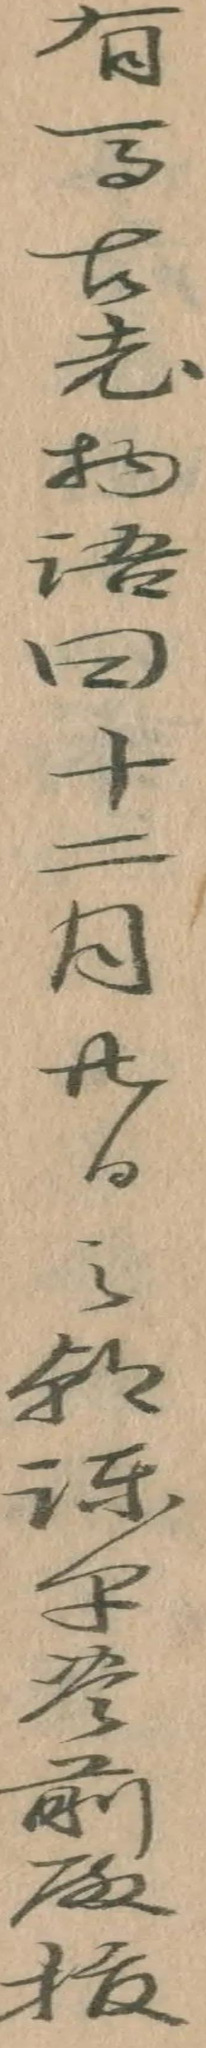有馬古老物語曰十二月廿日之朝諌早豊前殿抜
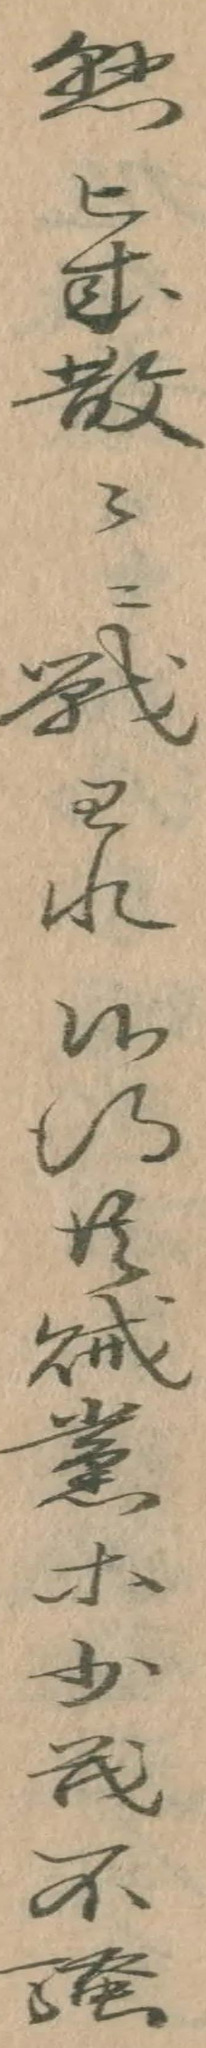懸被成散々に戦已れ候得共賊党等少茂不騒
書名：切支丹御退治記 49巻. [4]
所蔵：国立国会図書館 National Diet Library, JAPAN
